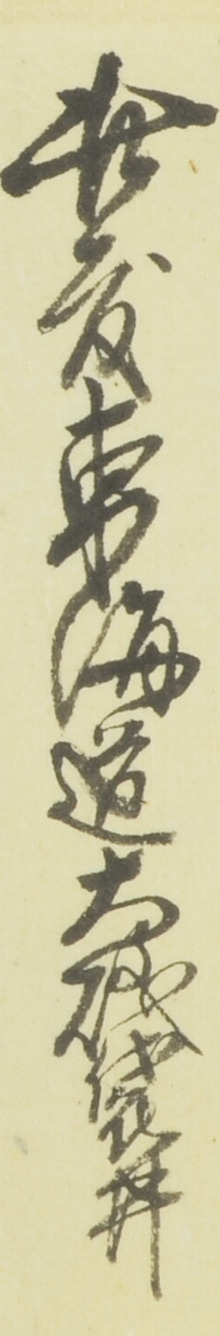此度東海道大磯袋井
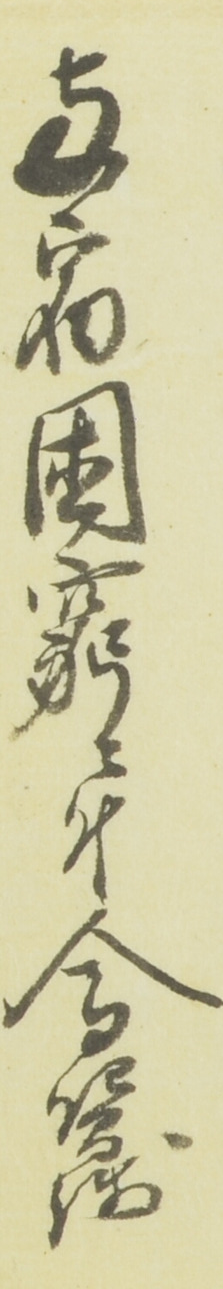両宿困窮ニ付人馬賃銭
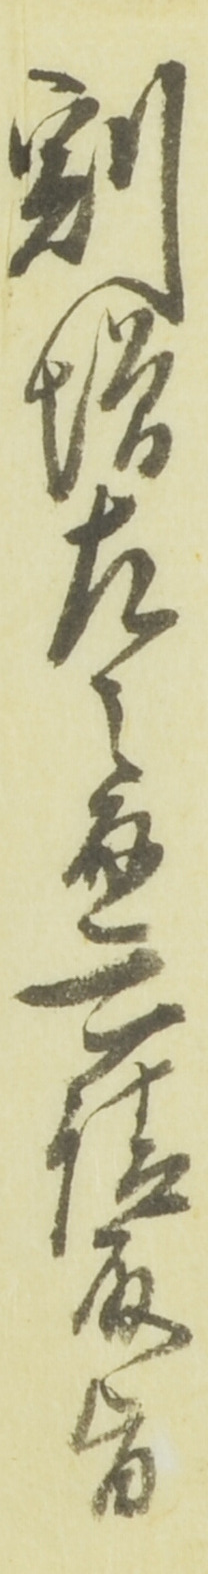割増左之通可請取旨
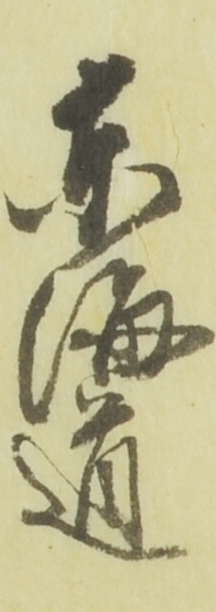東海道
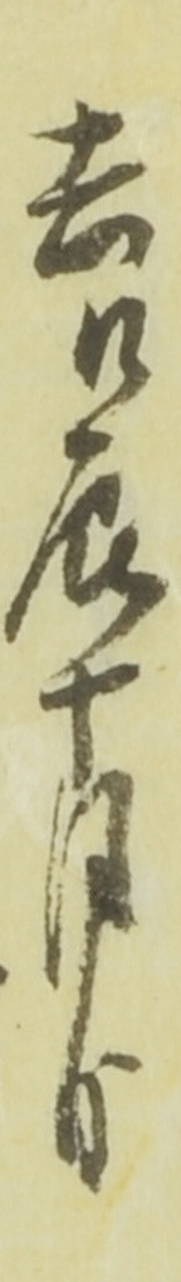去ル辰十月ゟ
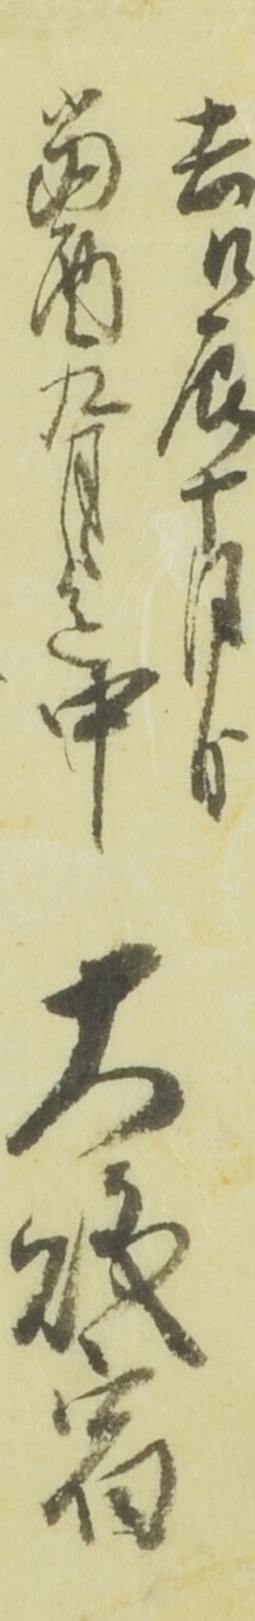当酉九月迄中大磯宿
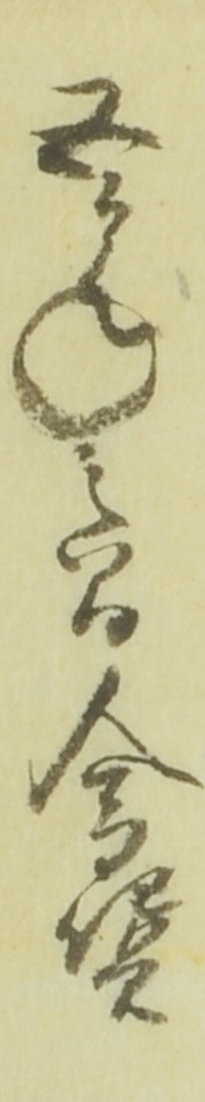五ヶ年之間人馬賃
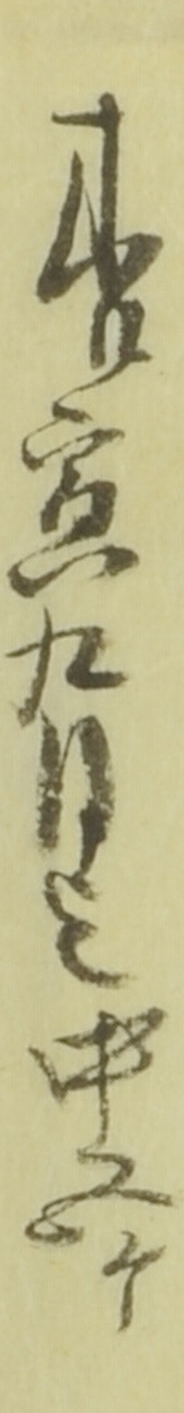来ル寅九月迄中五ヶ
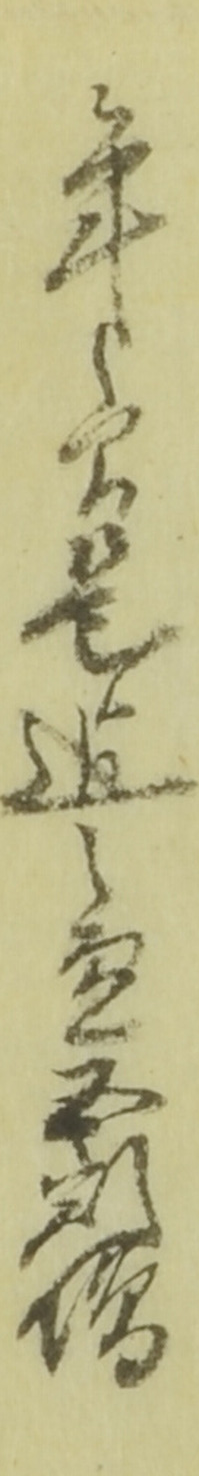年之間是迄之通五割増
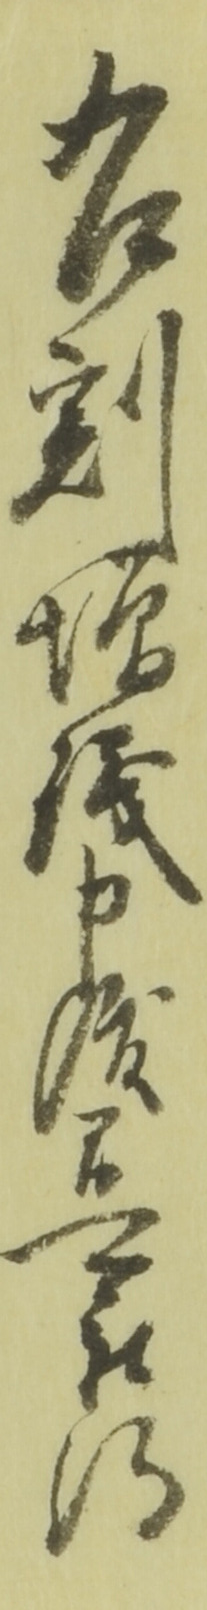右割増銭申渡間可被得
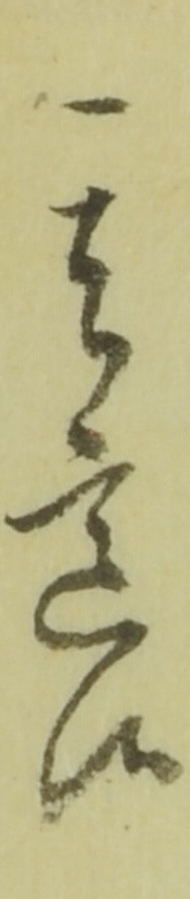其意候
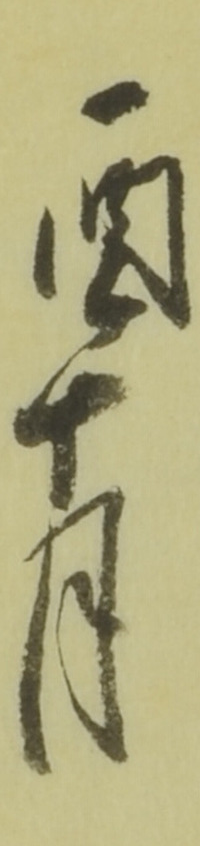酉十月
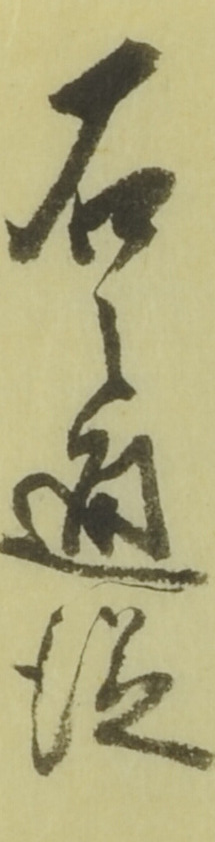右之通従

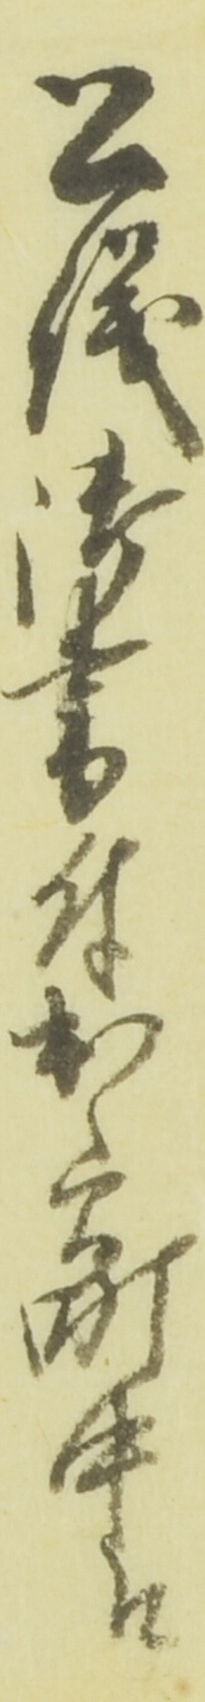公儀御書付出候間町中え
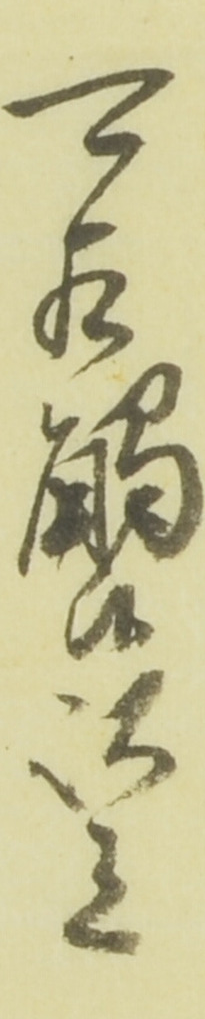可相触候以上
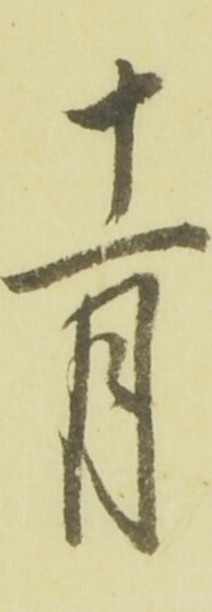十一月
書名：御触書御書附控
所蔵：伊那市立高遠町図書館・合同会社AMANE
